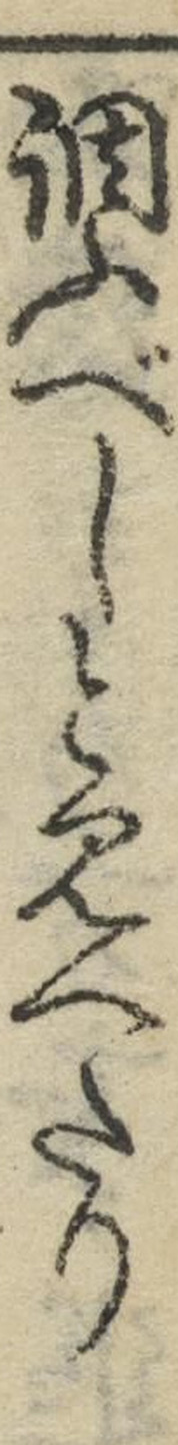調ふべしと見へたり
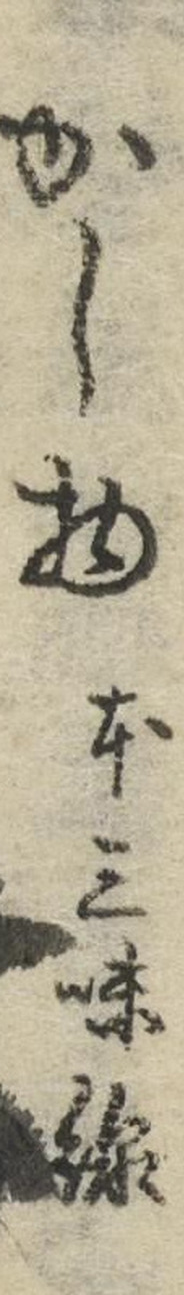かし物本三味線
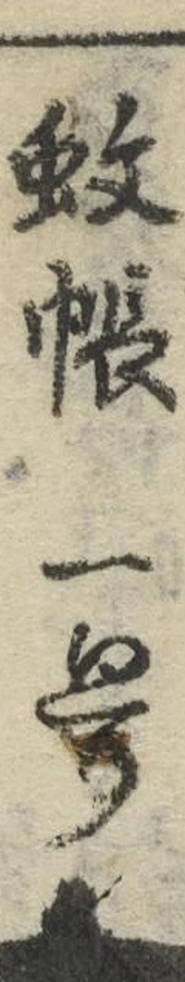蚊帳一廻り
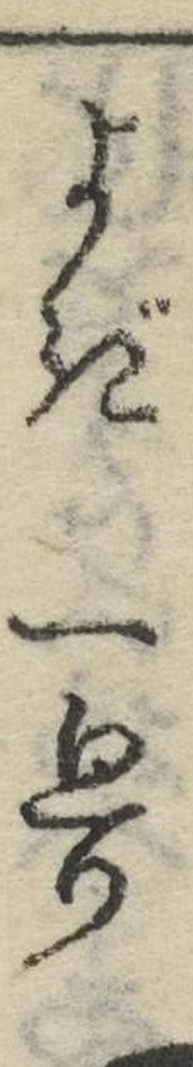よぎ一廻り
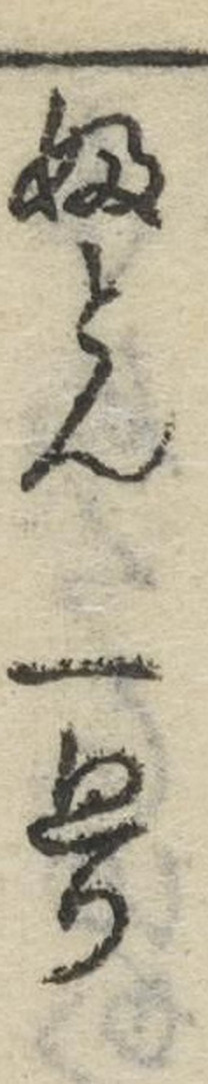ふとん一廻り
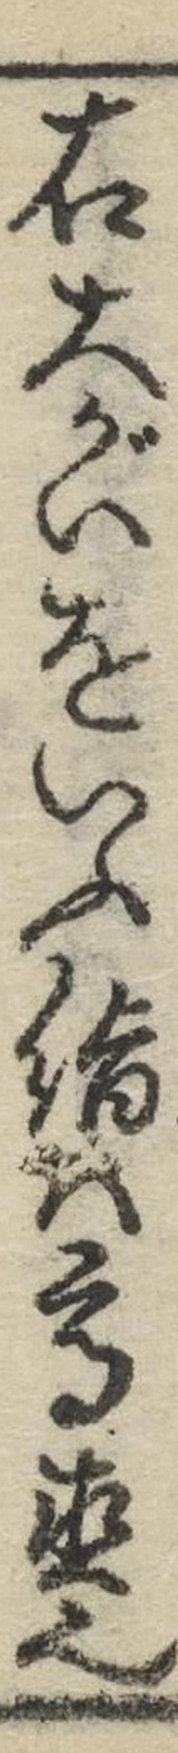右大がいをいふ絹は高直也
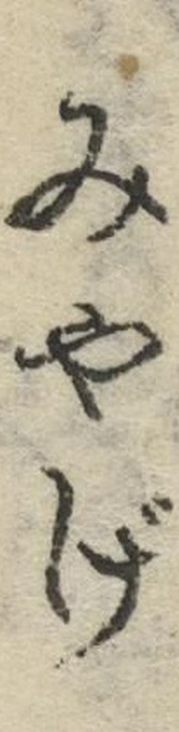みやげ
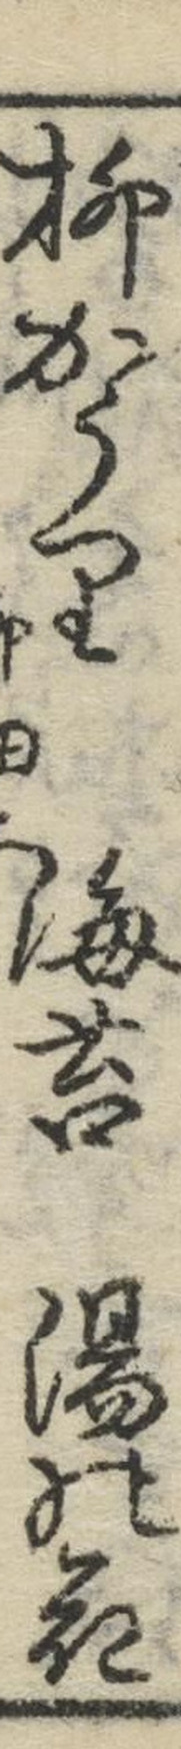柳かうり海苔湯の花
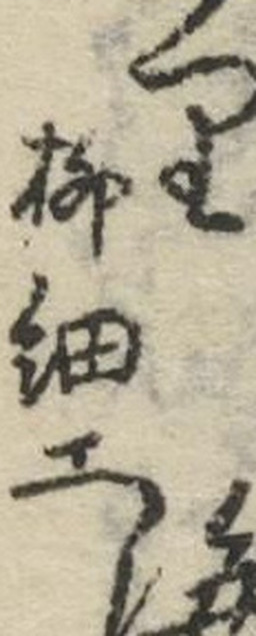柳細工
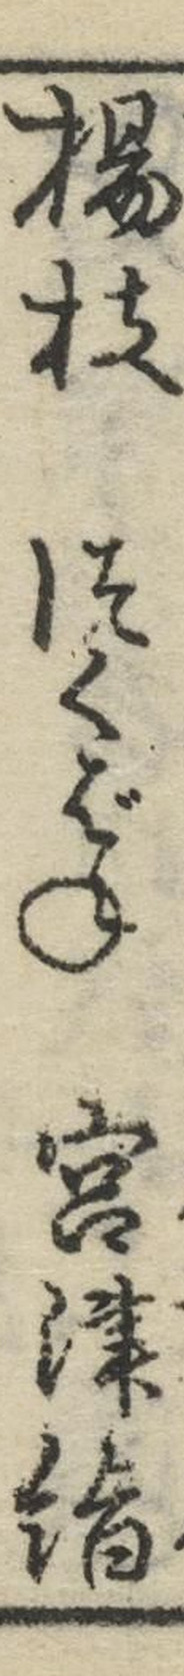楊枝つくばね宮津絹
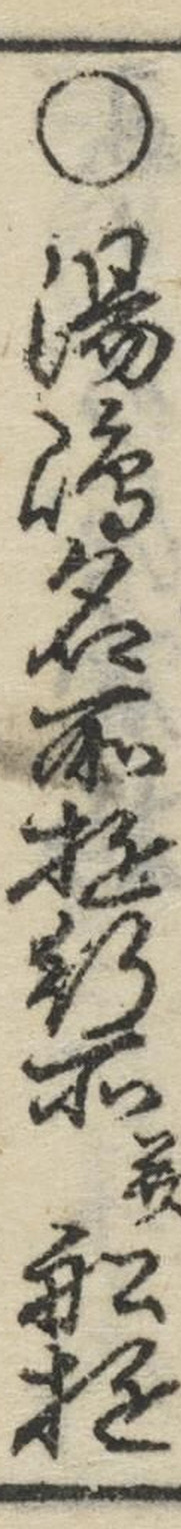〇湯島名所遊行所並舩遊
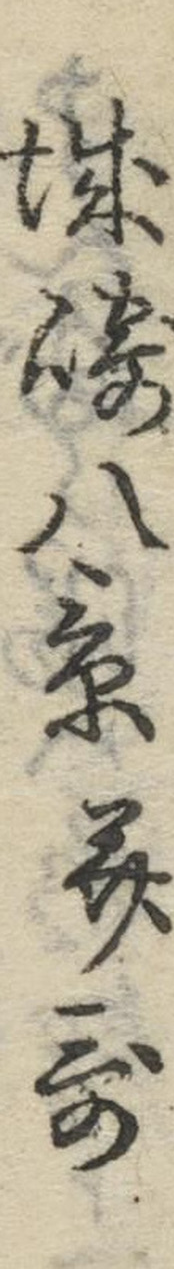城崎八景並歌
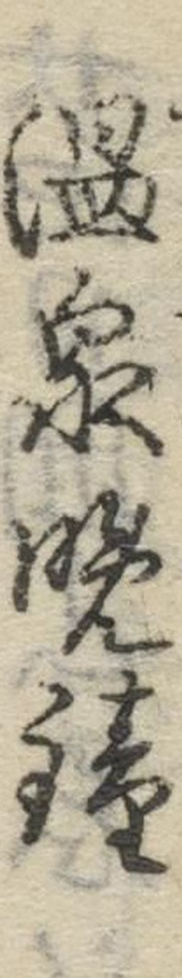温泉晩鐘
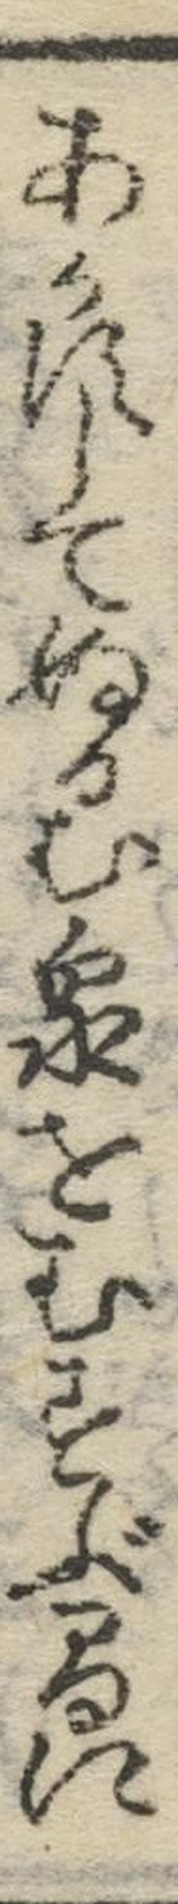あかすしてぬるむ泉をむすぶ間に
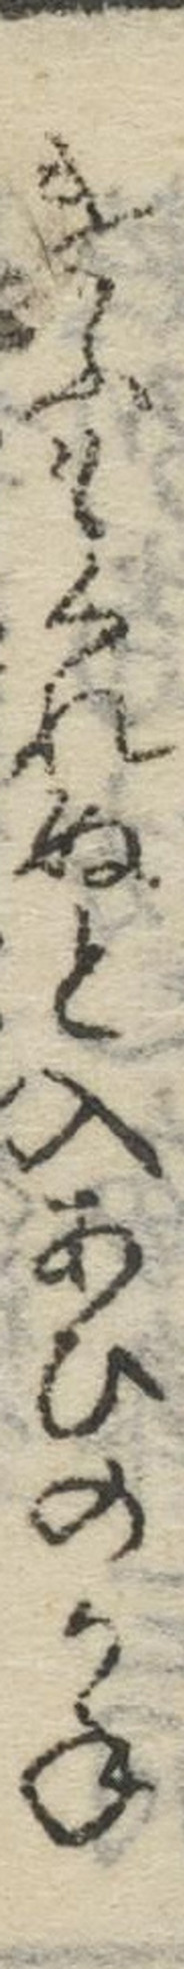けふもくれぬと入あひのかね
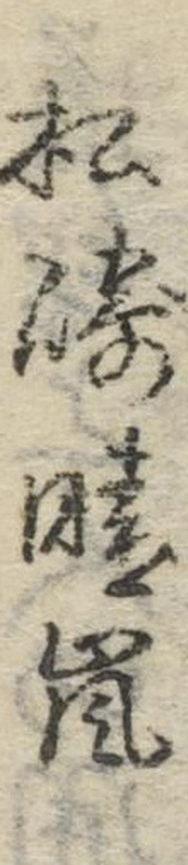松崎晴嵐
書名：但州城崎浴湯辧
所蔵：東京大学地震研究所図書室 Earthquake Research Institute Library, The University of Tokyo, JAPAN
